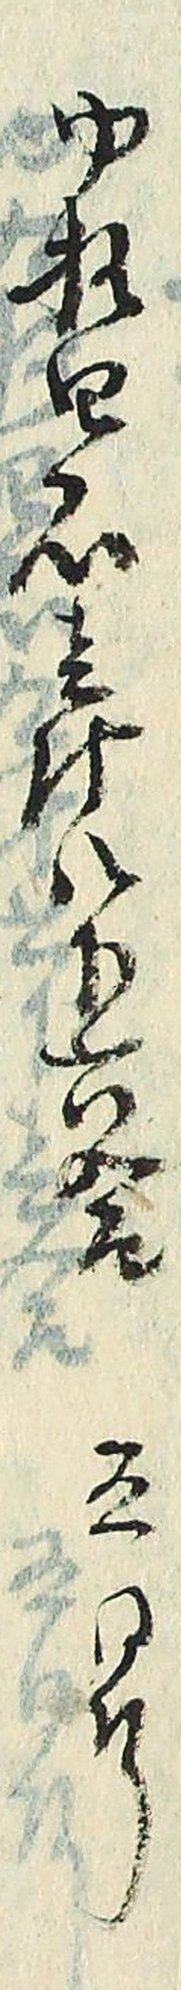内拾四石壱斗八升六合右同断
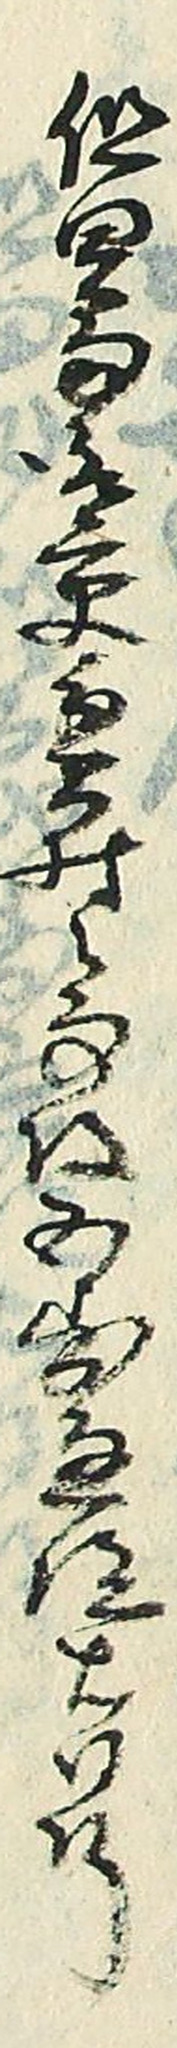但田畠取交貧村之事故五歩通位右同断

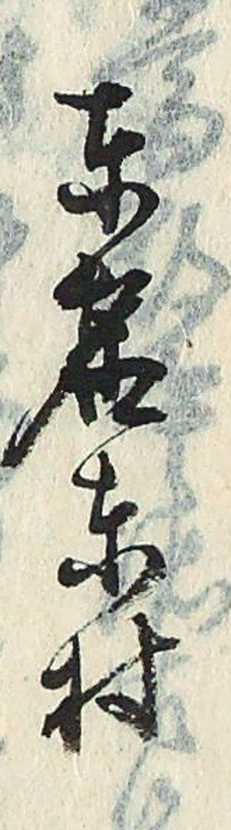東名東村
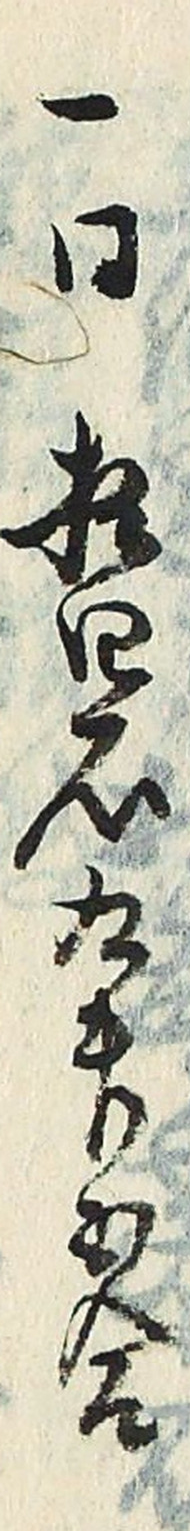一同拾四石九升五合
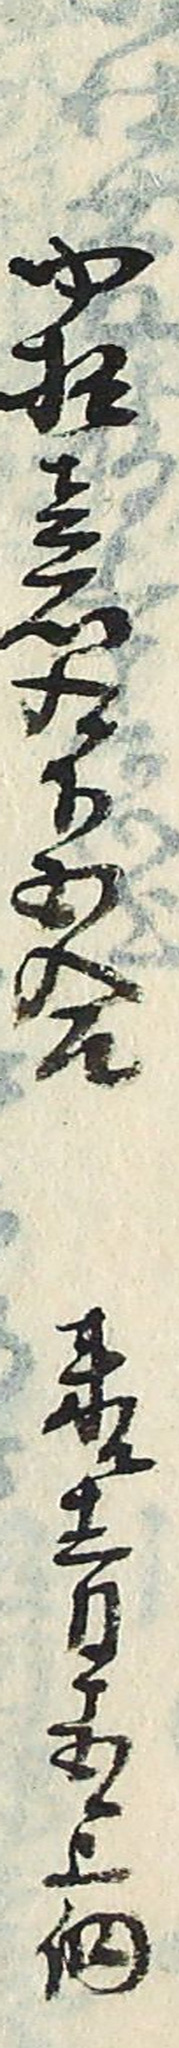内拾壱石九升五合来十二月十五日上納
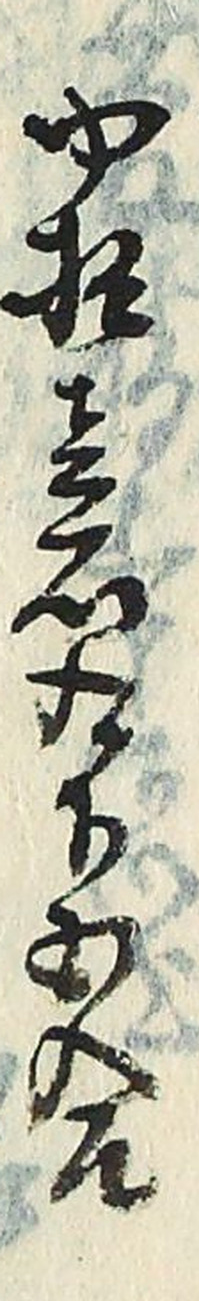一同拾四石九升五合
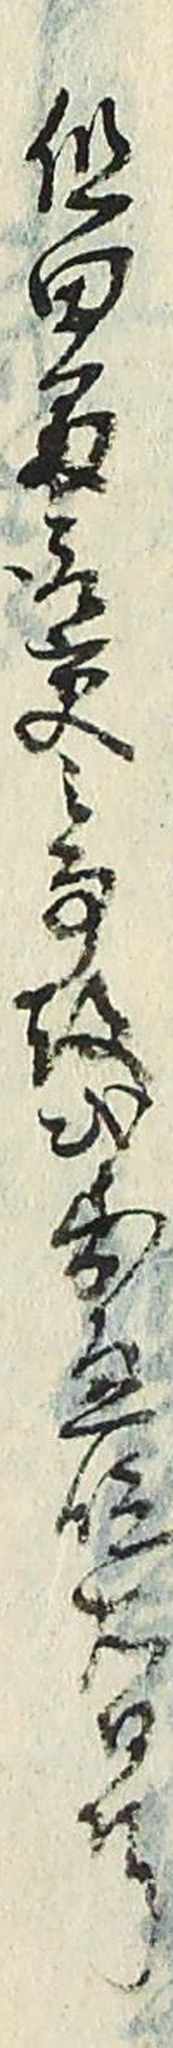但田畠取交之事故弐歩通位右同断
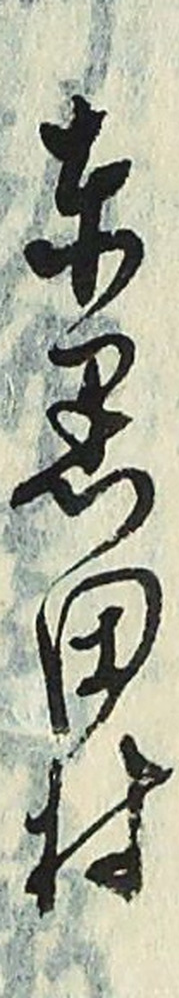東黒田村
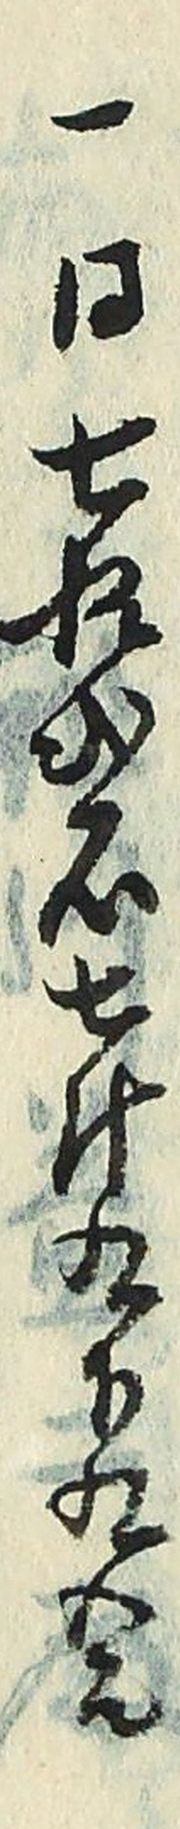一同七拾弐石七斗九升九合
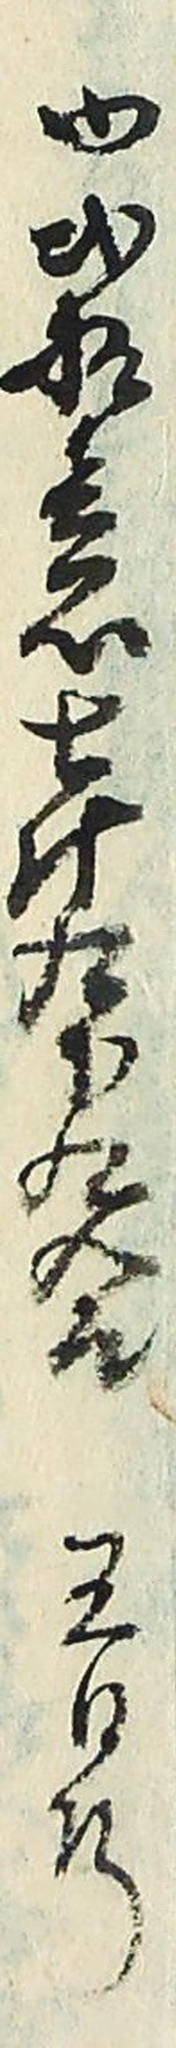内弐拾壱石七斗九升九合右同断
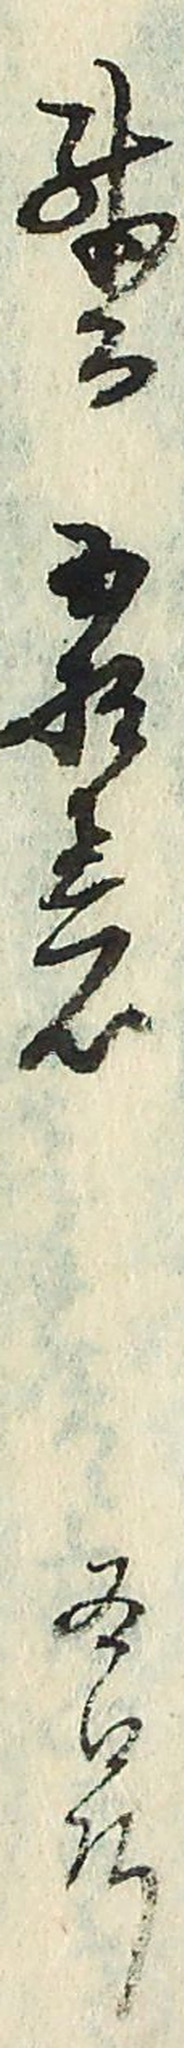残而五拾壱石右同断
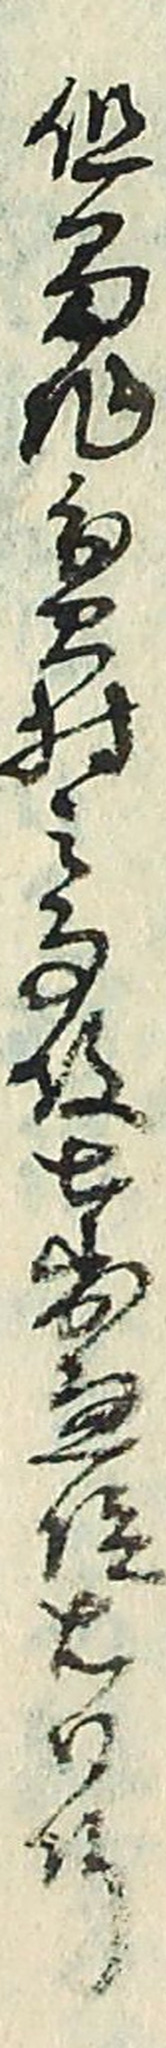但畠作貧村之事故七歩通位右同断
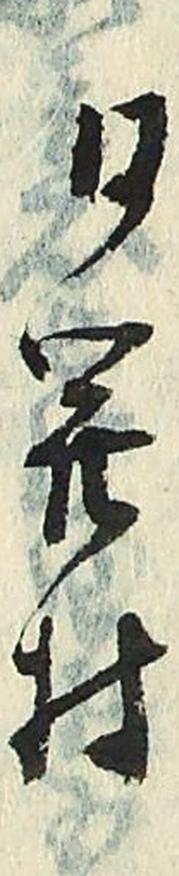日開村
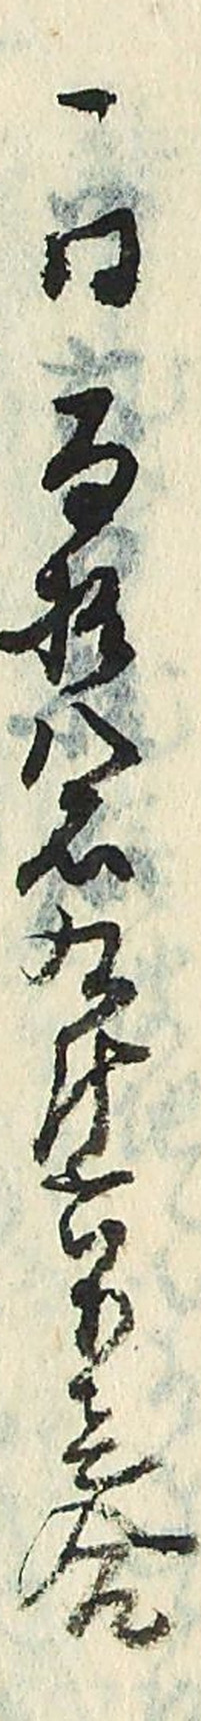一同百拾八石九斗六升壱合
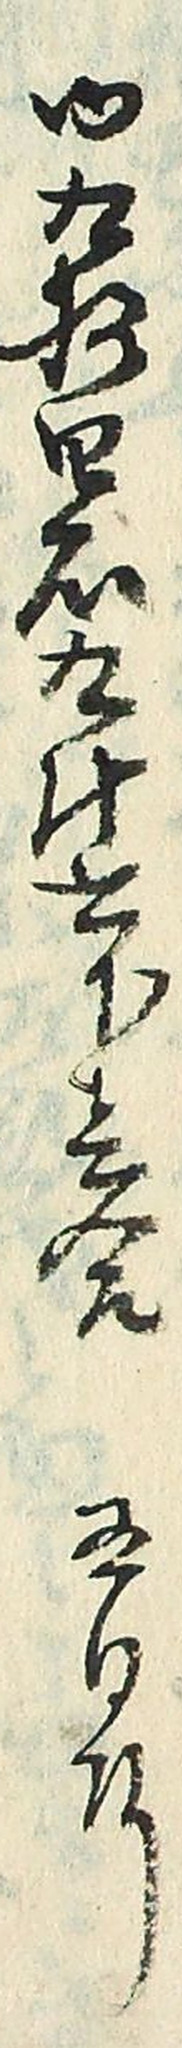内九拾四石九斗六升壱合右同断
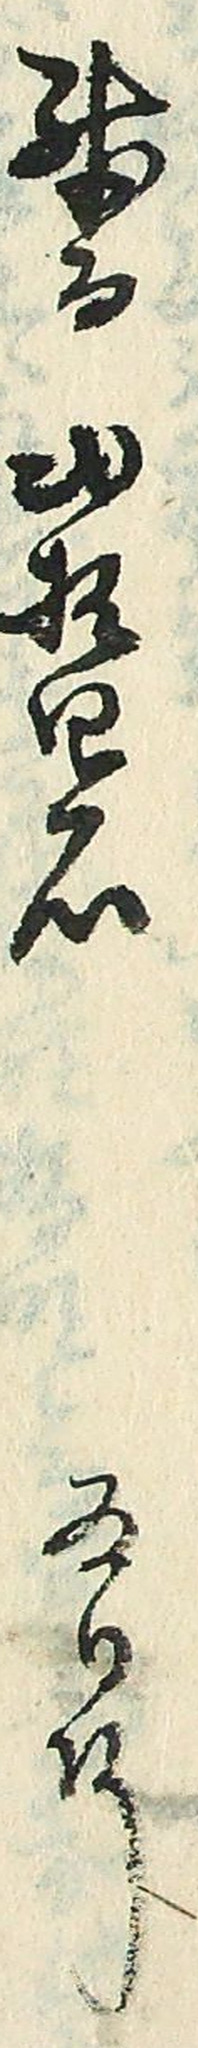残而弐拾四石右同断
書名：諸御趣意書并御下知向之写
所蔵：鳴門教育大学 Naruto University of Education
